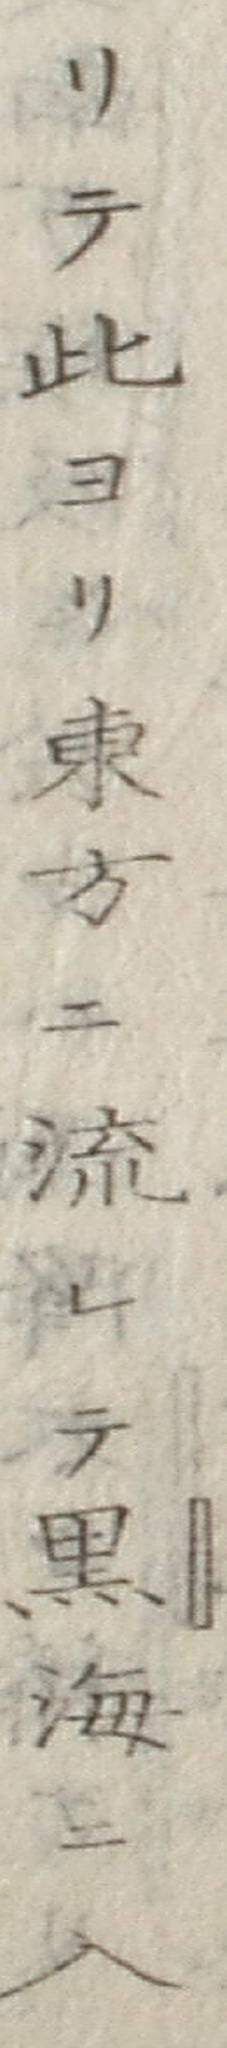リテ此ヨリ東方ニ流レテ黒海ニ入
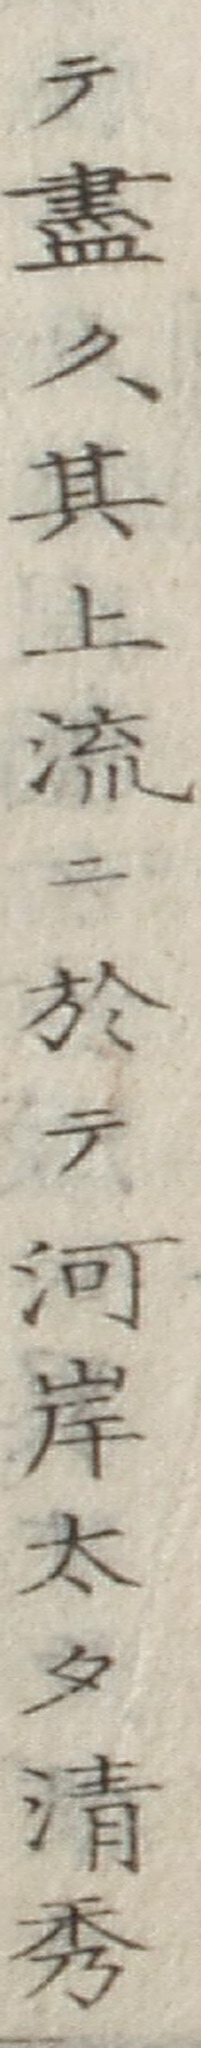テ尽ク、其上流ニ於テ河岸太タ清秀
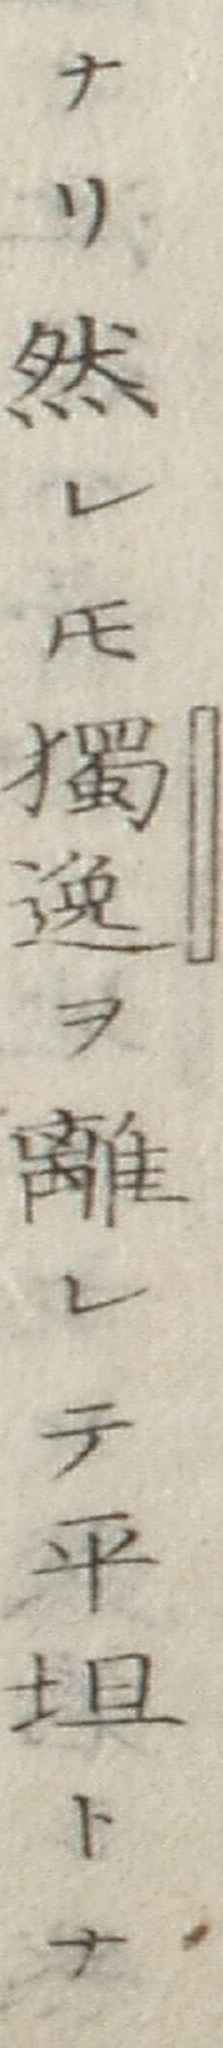ナリ然レトモ独逸ヲ離レテ平坦トナ
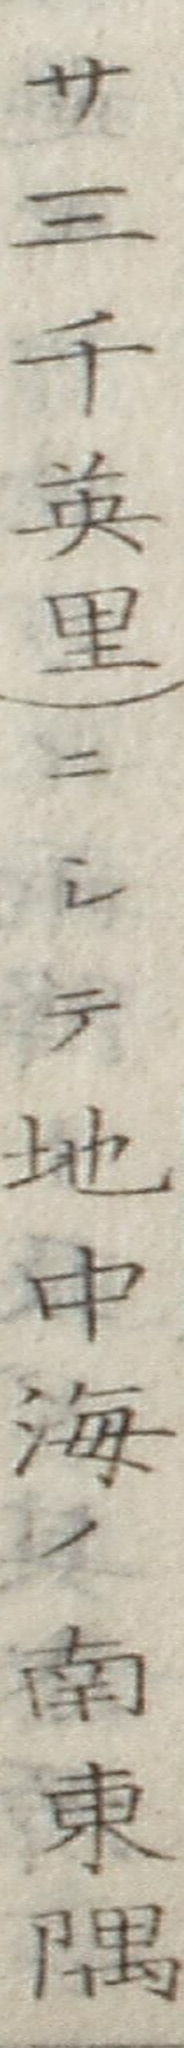サ三千英里）ニシテ地中海ノ南東隅
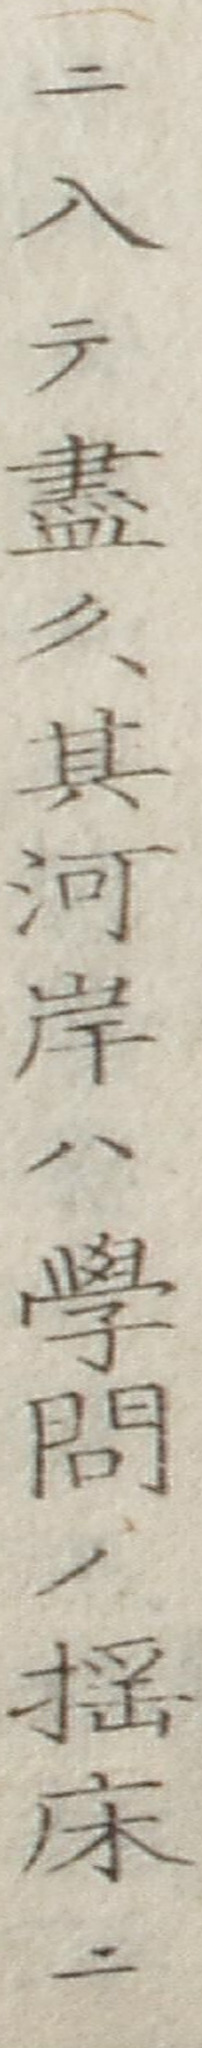ニ入テ尽ク、其河岸ハ学問ノ揺床ニ
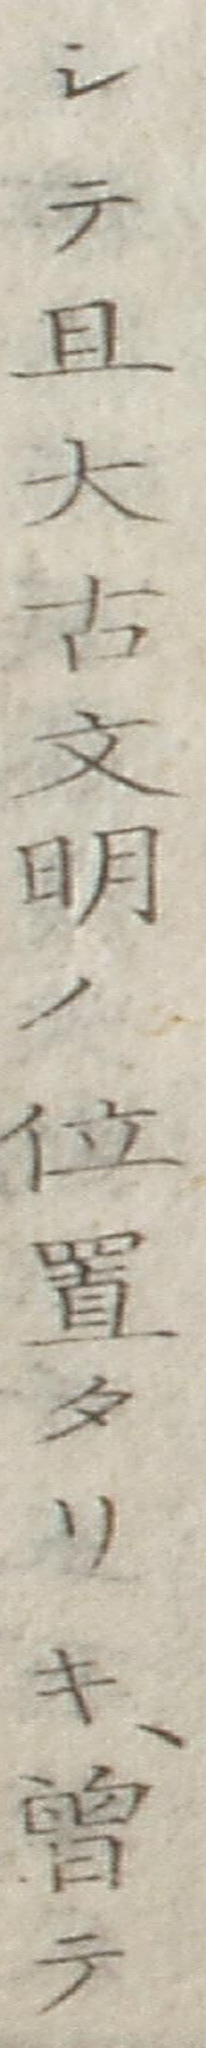シテ且太古文明ノ位置タリキ、曽テ
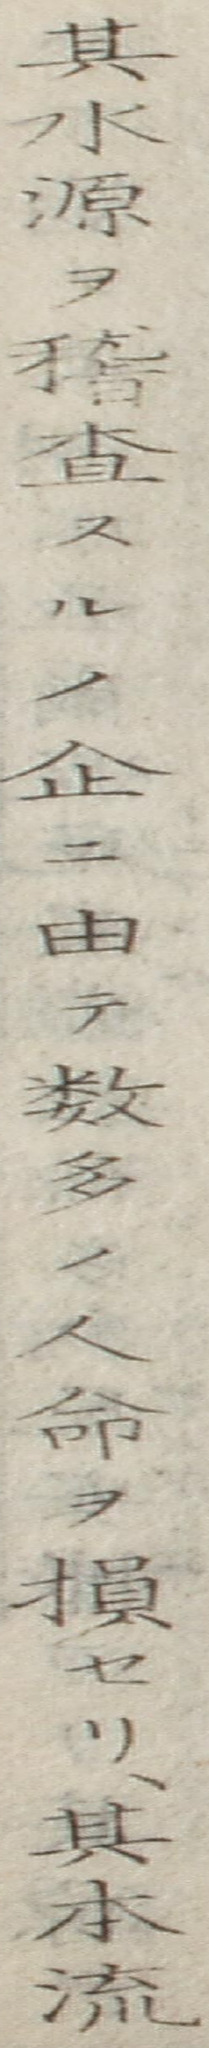其水源ヲ稽査スルノ企ニ由テ数多ノ人命ヲ損セリ、其本流

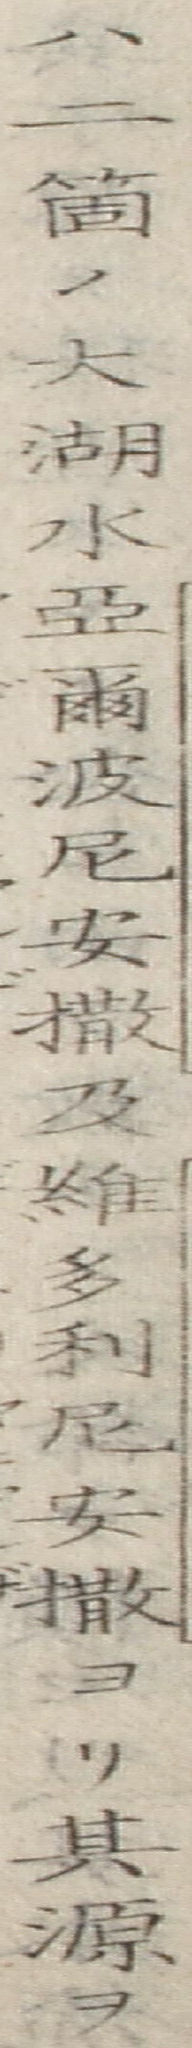ハ二箇ノ大湖水亜爾波尼安撤及維多利尼安撤ヨリ其源ヲ
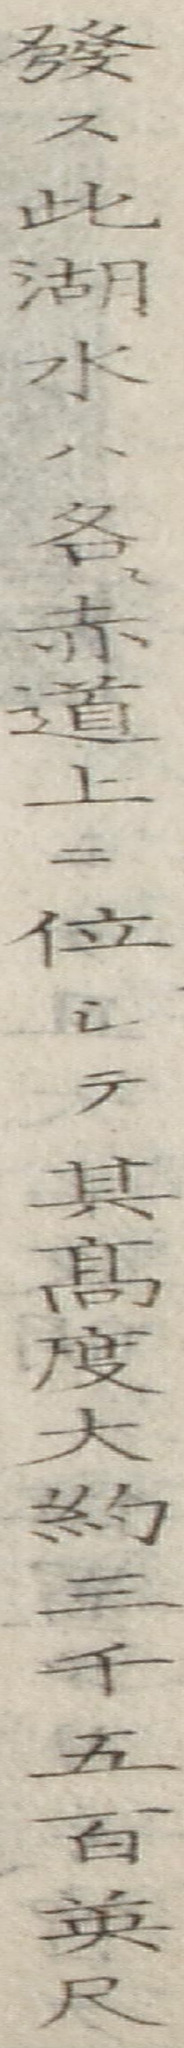発ス此湖水ハ各々赤道上ニ位シテ其高度大約三千五百英尺
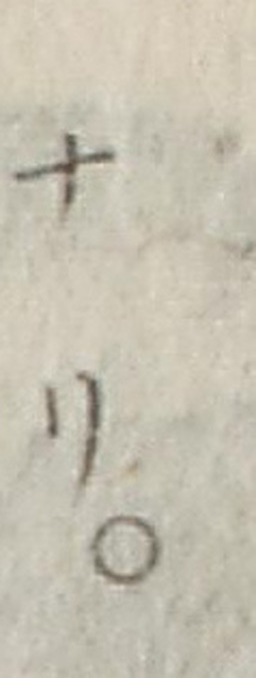ナリ。
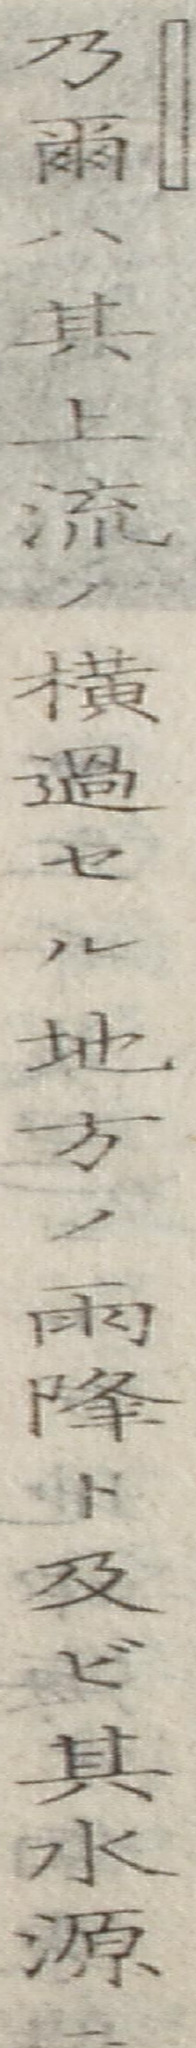乃爾ハ其上流ノ横過セル地方ノ雨降ト及ビ其水源ニ
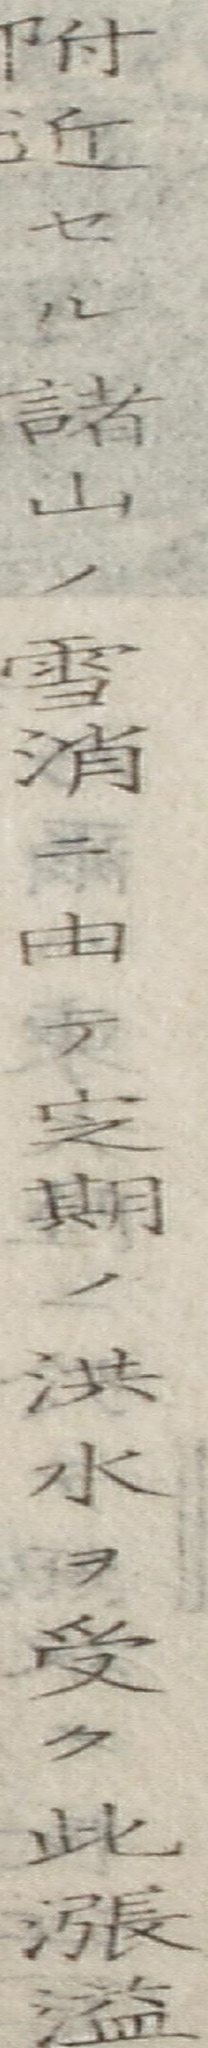附近セル諸山ノ雪消ニ由テ定期ノ洪水ヲ受ク此漲溢
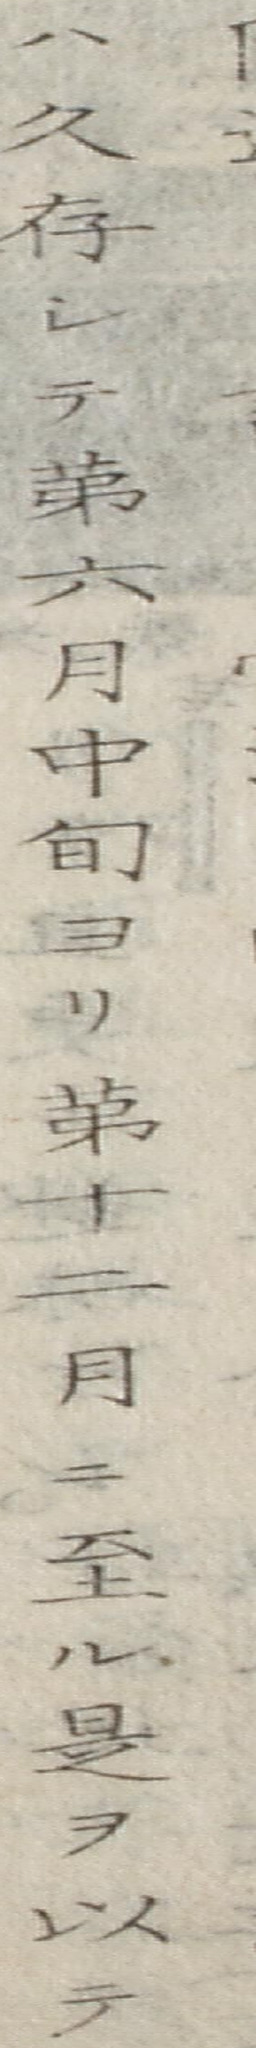ハ久存シテ第六月中旬ヨリ第十二月ニ至ル是ヲ以テ
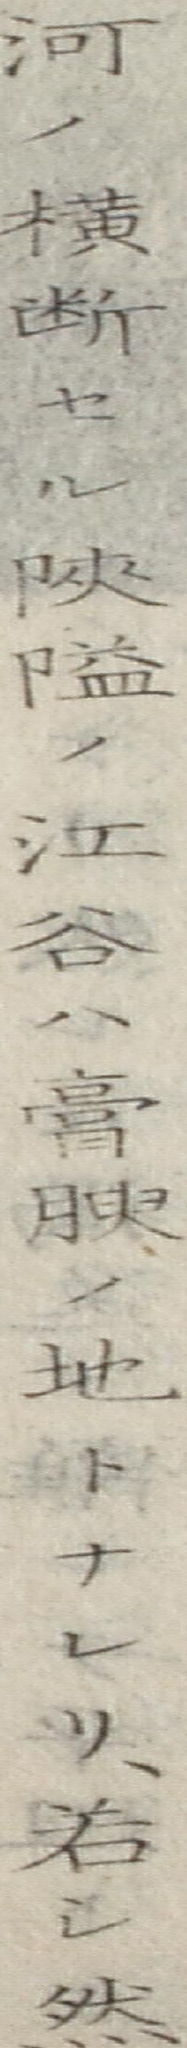河ノ横断セル陜隘ノ江谷ハ膏腴ノ地トナレリ、若シ然
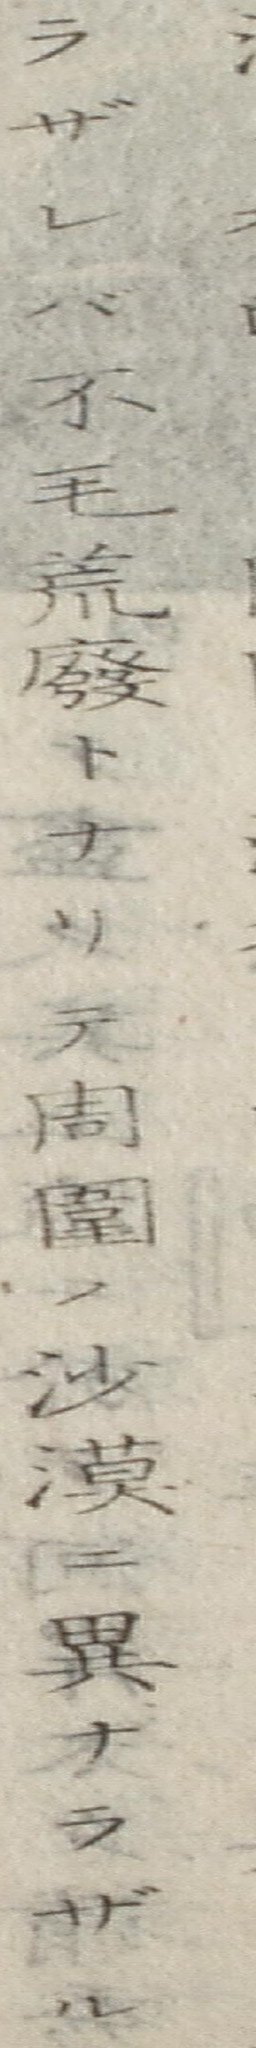ラザレバ不毛荒発トナリテ周囲ノ砂漠ニ異ナラザル
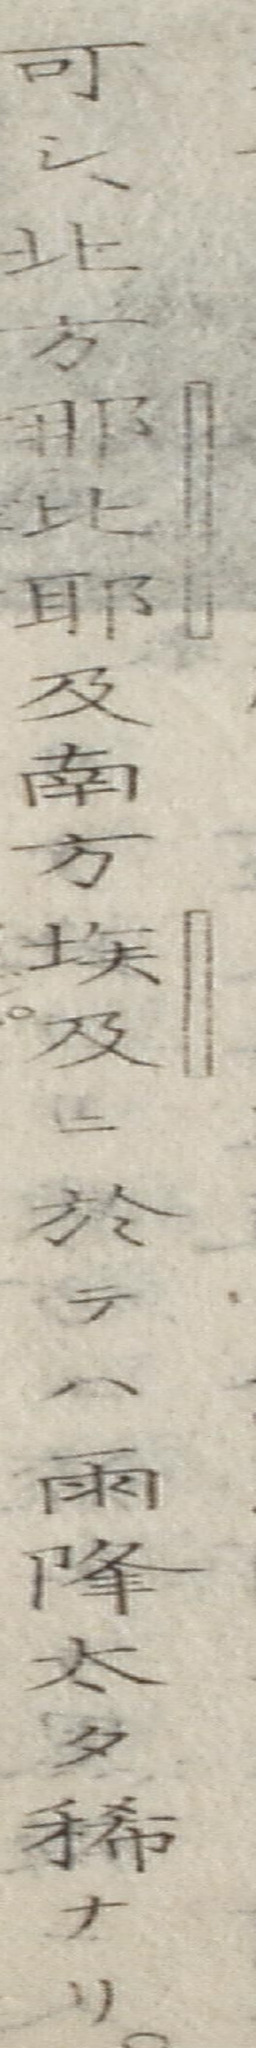可シ、北方那比耶及南方埃及ニ於テハ雨降太タ稀ナリ。
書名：地形論　巻二
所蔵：東京大学地震研究所図書室 Earthquake Research Institute Library, The University of Tokyo, JAPAN
